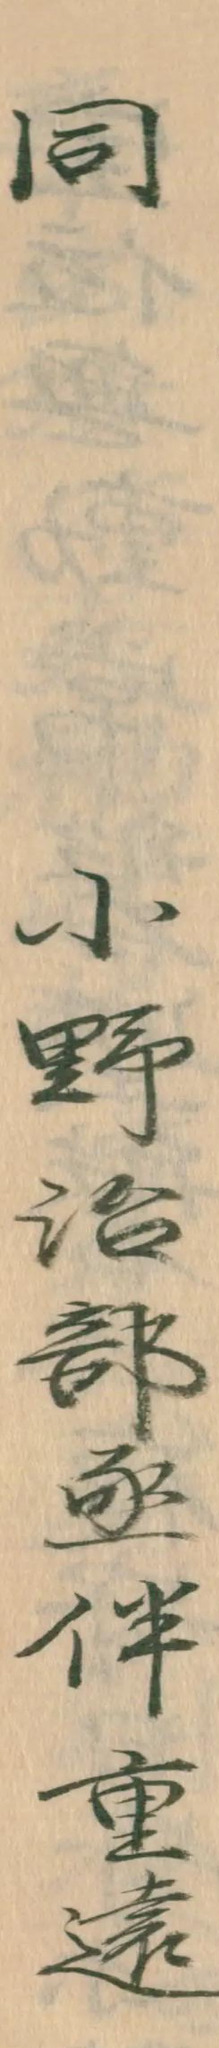同小野治部丞伴重遠
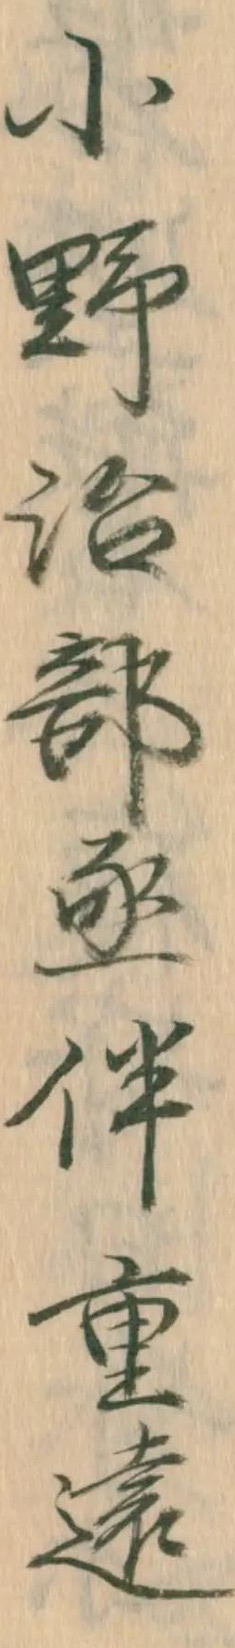同小野治部丞伴重遠
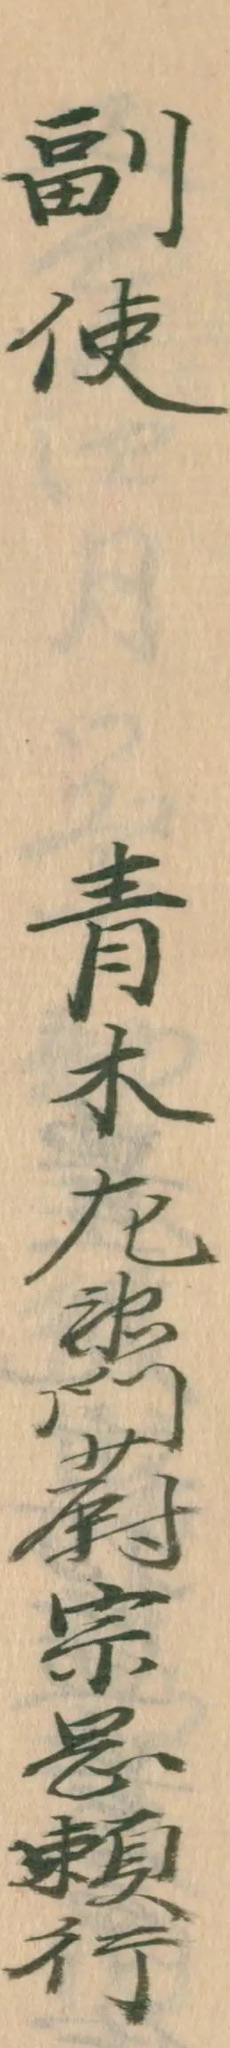副使青木左衛門少尉宗岡頼行
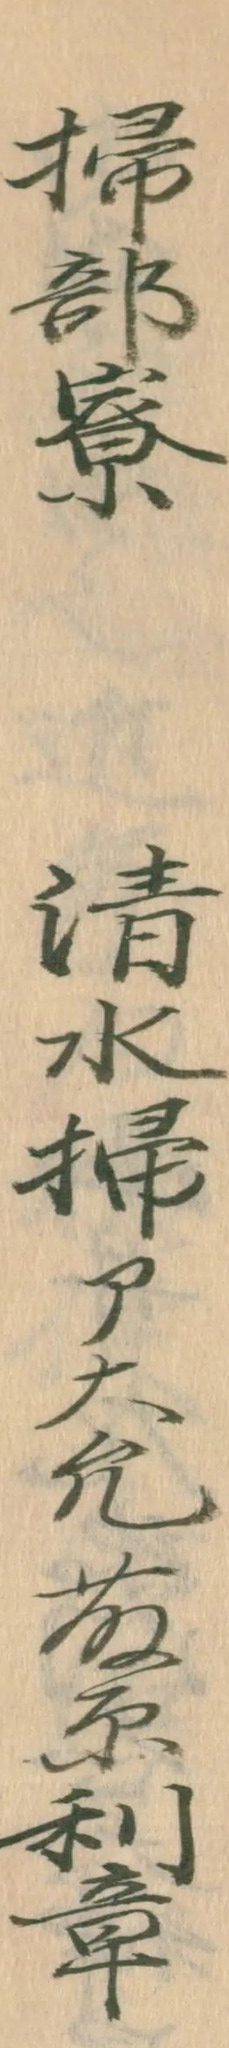掃部寮清水掃部大允藤原利章
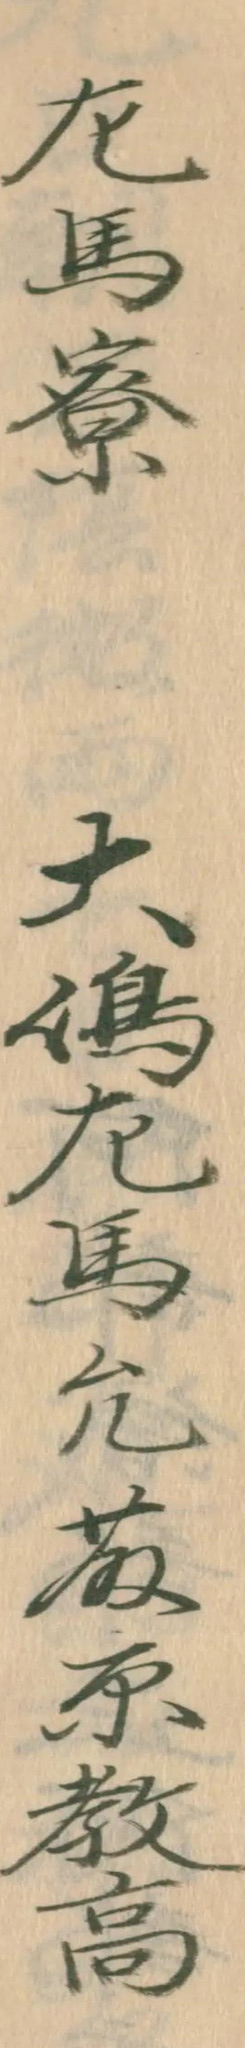左馬寮大嶋左馬允藤原教高
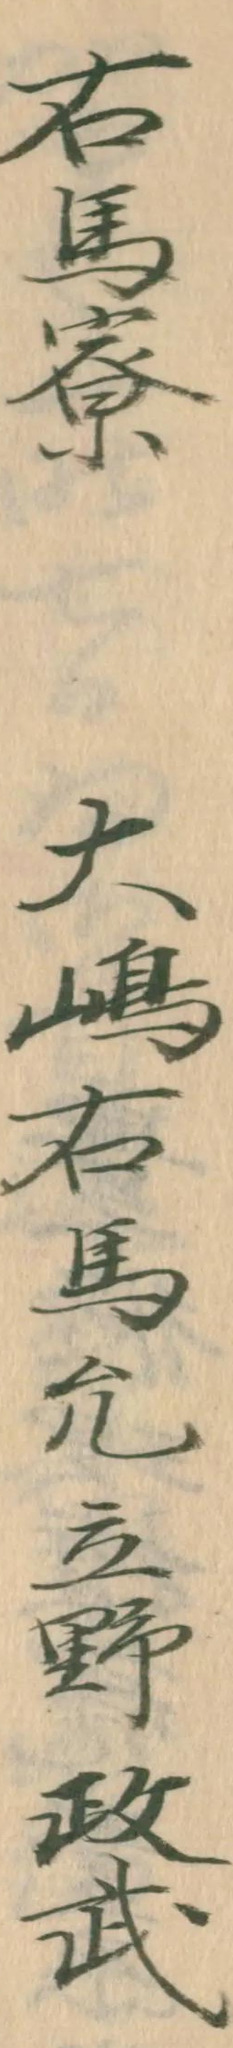右馬寮大嶋右馬允立野政武
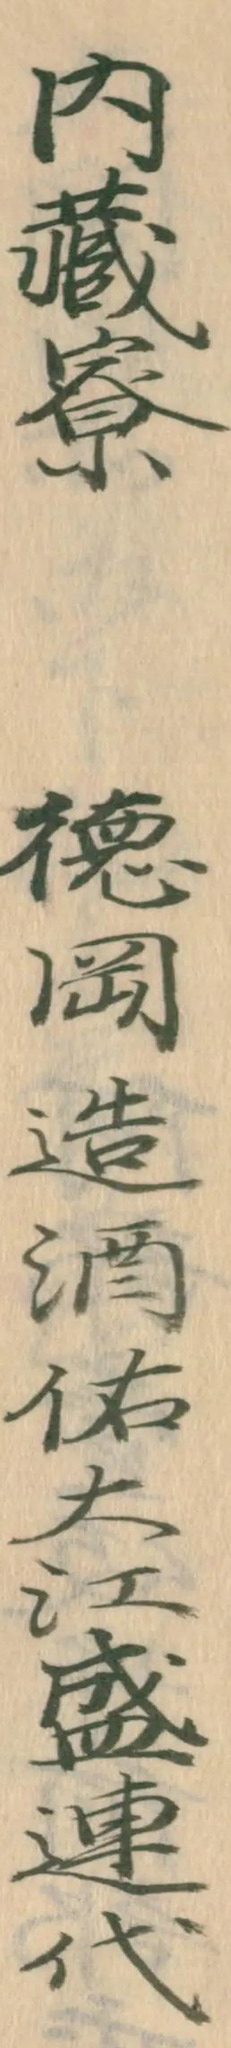内蔵寮徳岡造酒佑大江盛連代
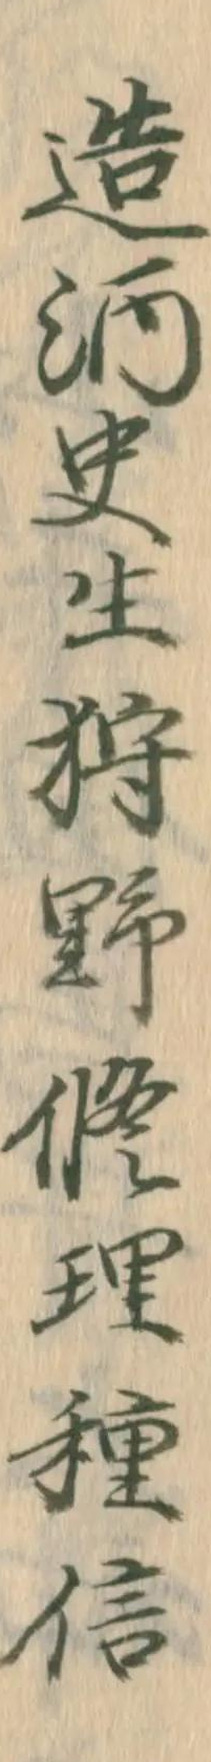造酒史生狩野修理種信
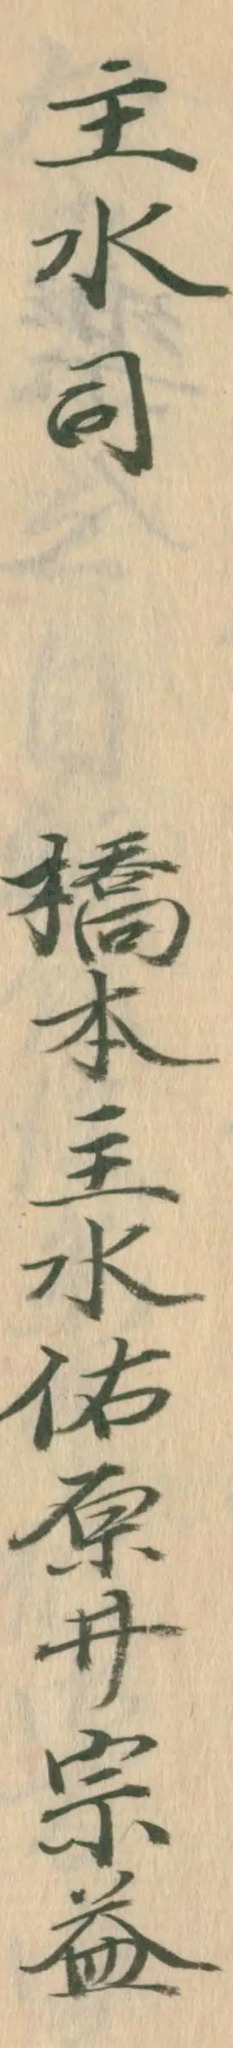主水司橋本主水佑原井宗益
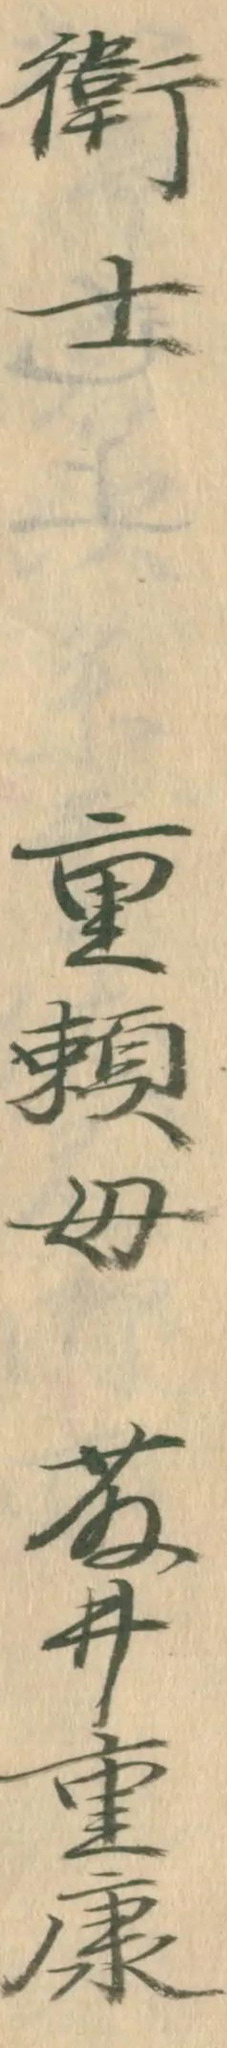衛士重頼母藤井重康
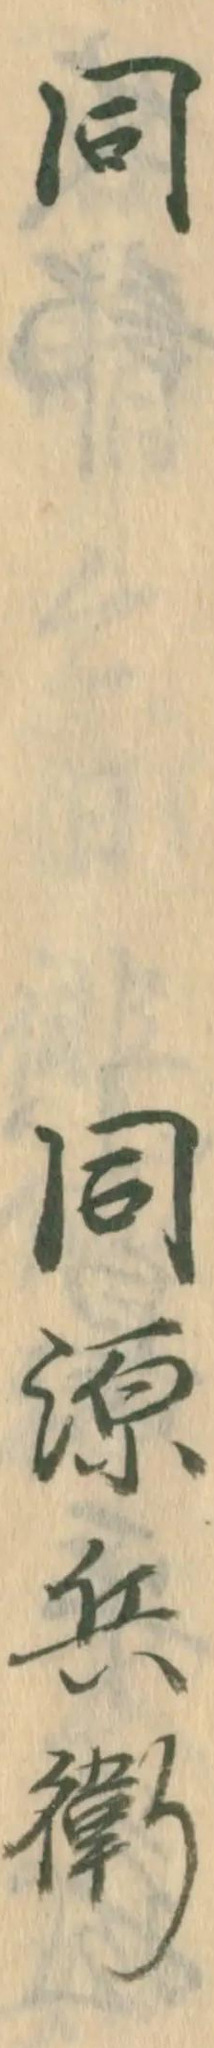同同源兵衛

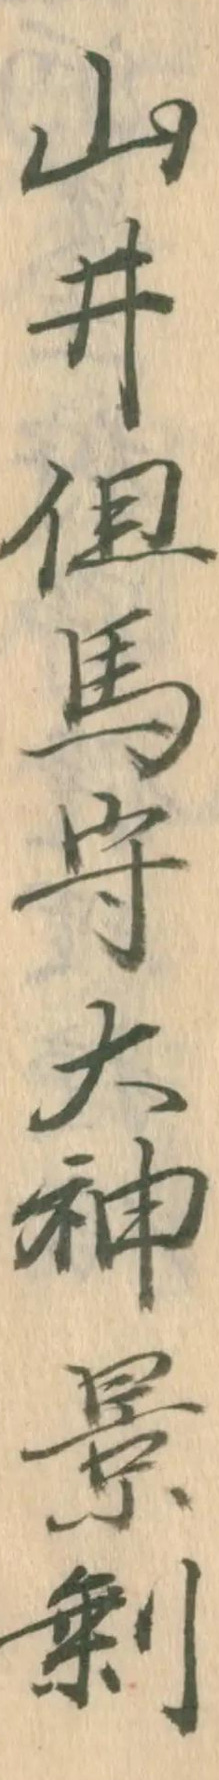山井但馬守大神景剰
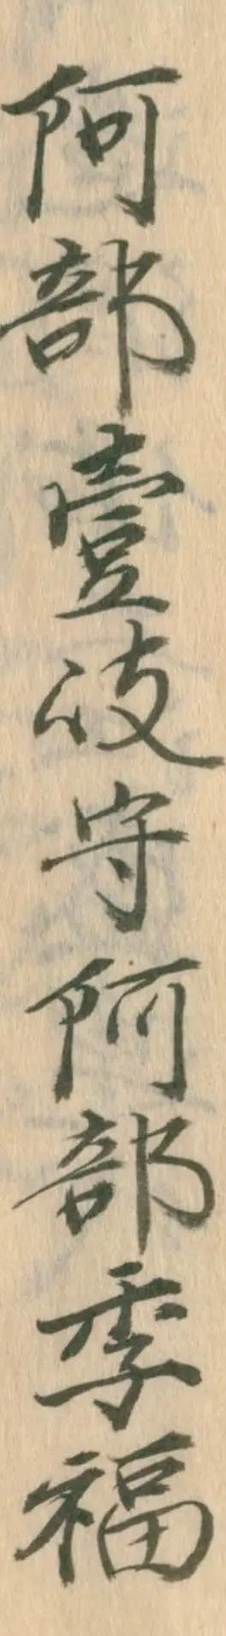阿部壱岐守阿部季福
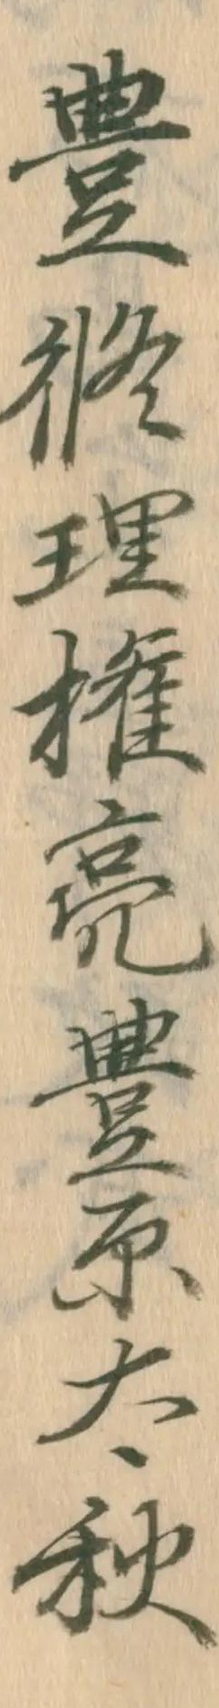豊修理権亮豊原太秋
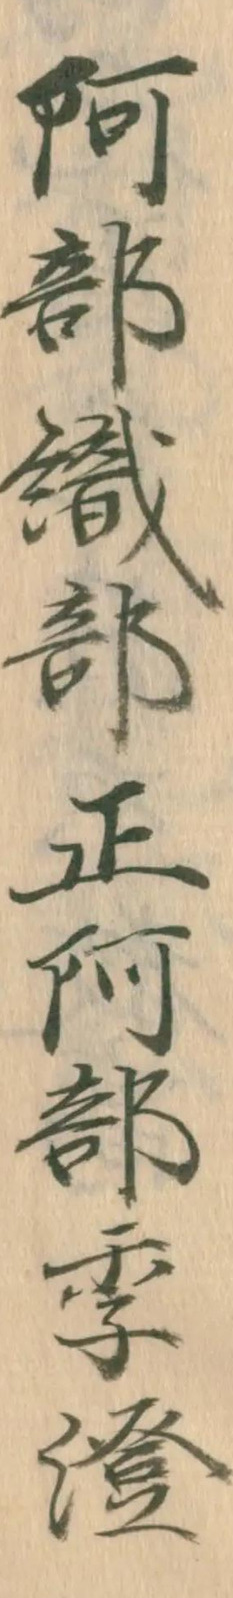阿部織部正阿部季澄
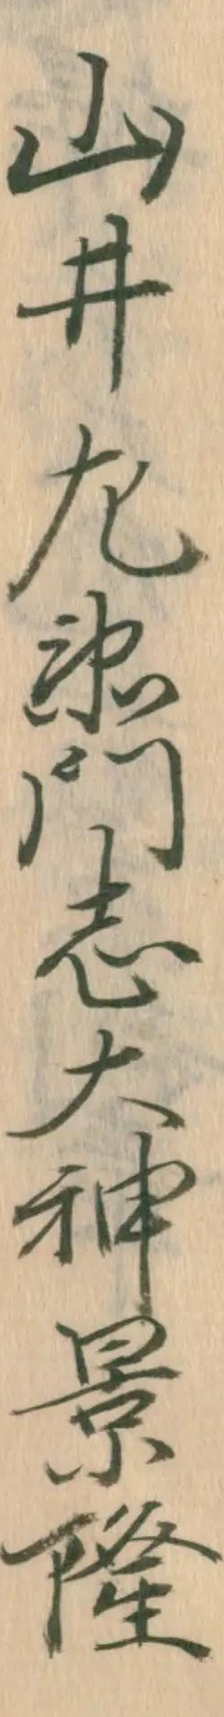山井左衛門志大神景隆
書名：賀茂社記録. 第16冊
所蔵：国立国会図書館 National Diet Library, JAPAN
